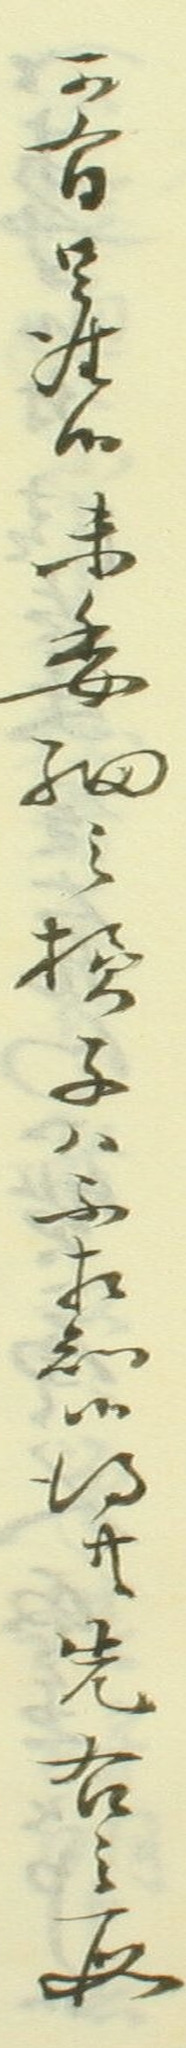可有御座候未委細之様子は不相知候得得共先右之段
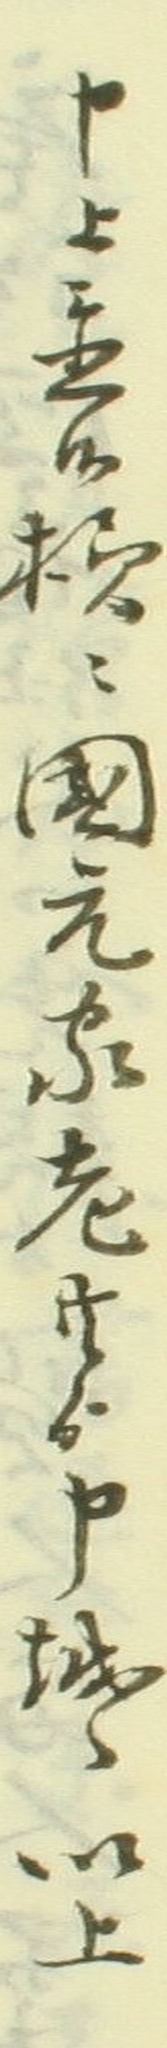申上置候様に国元家老共ゟ申越候以上
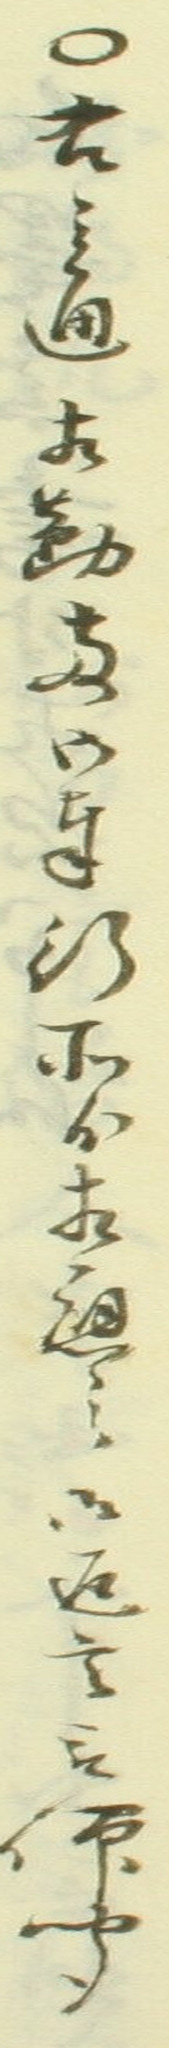〇右之通相勤両御奉行所ゟ相応之御返言被仰聞
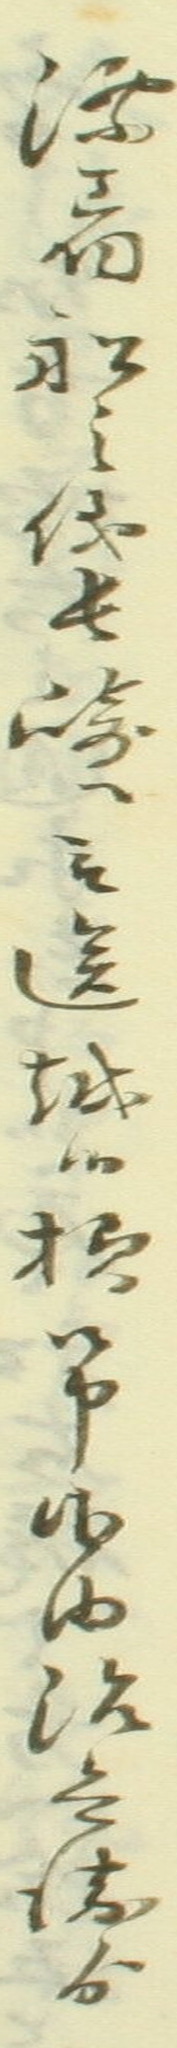漂着船之儀長崎へ被送越候様御申候由治兵衛ゟ
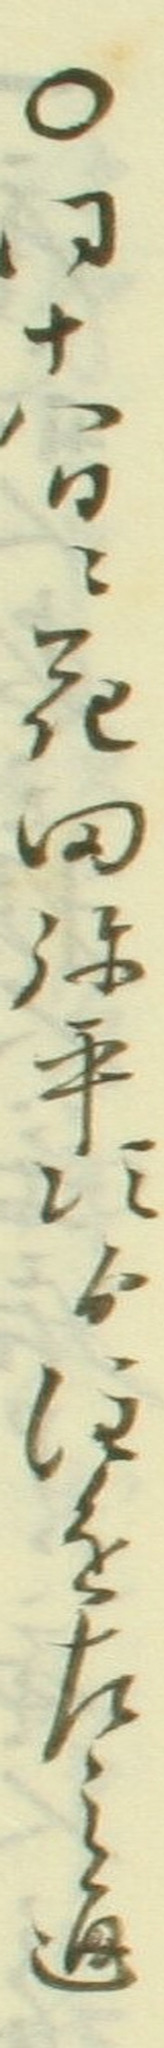〇同十八日に花田弥平次ゟ注進左之通
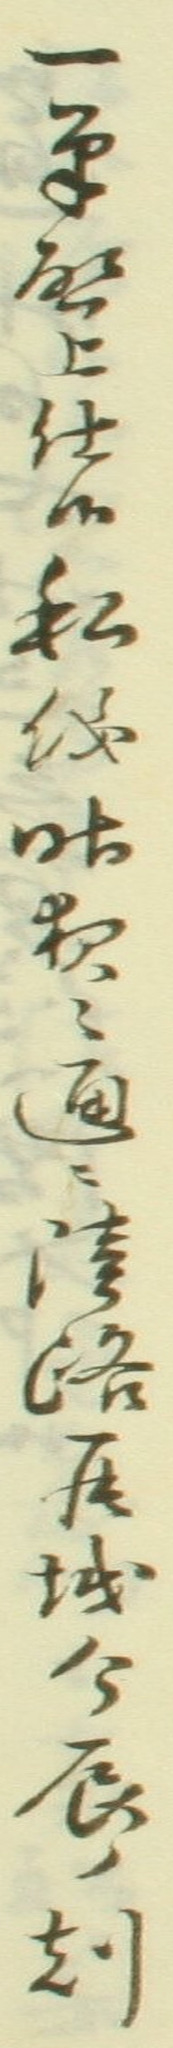一筆啓上仕候私儀昨夜之通に陸路罷越今辰ノ刻
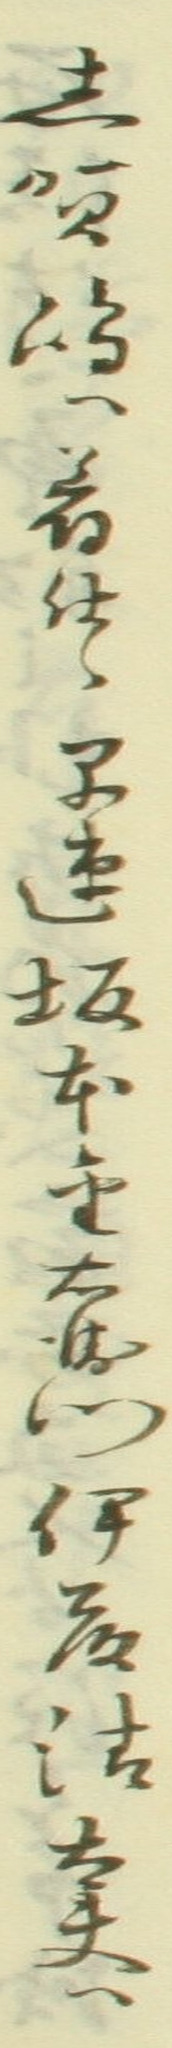志賀島へ着仕候早速坂本金右衛門伊藤清太夫へ

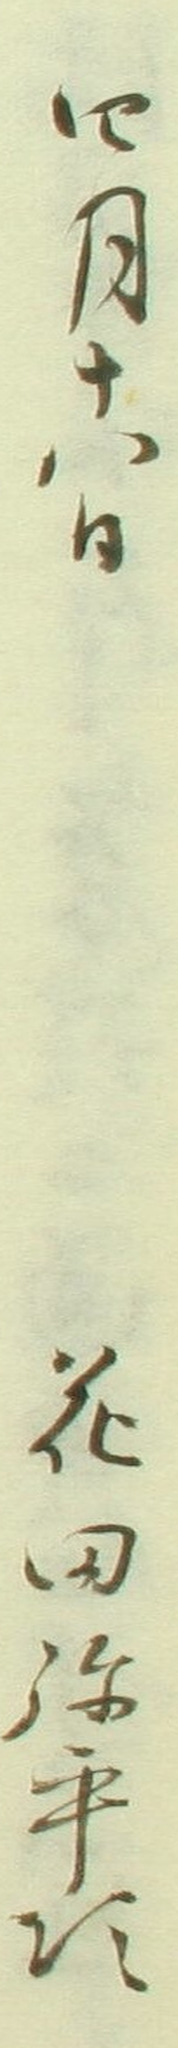四月十八日花田弥平次
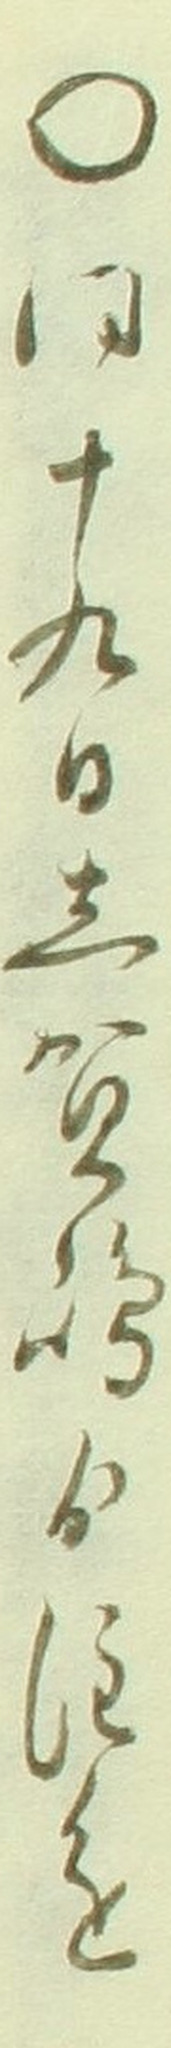〇同十九日志賀島ゟ注進
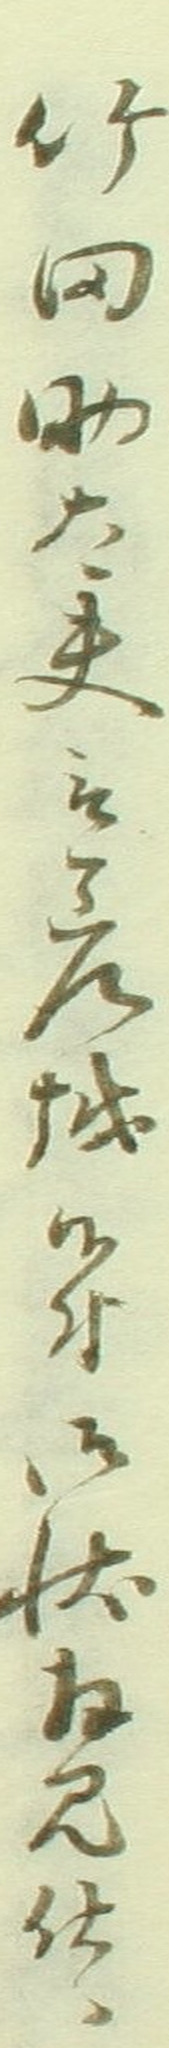竹田助太夫被差越候付御状拝見私仕候
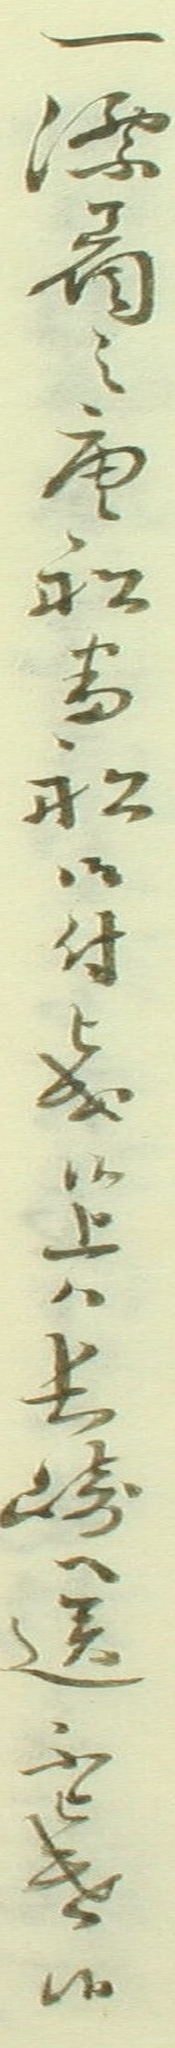一漂着之唐船番船御付被成以上は長崎へ送不被遣候
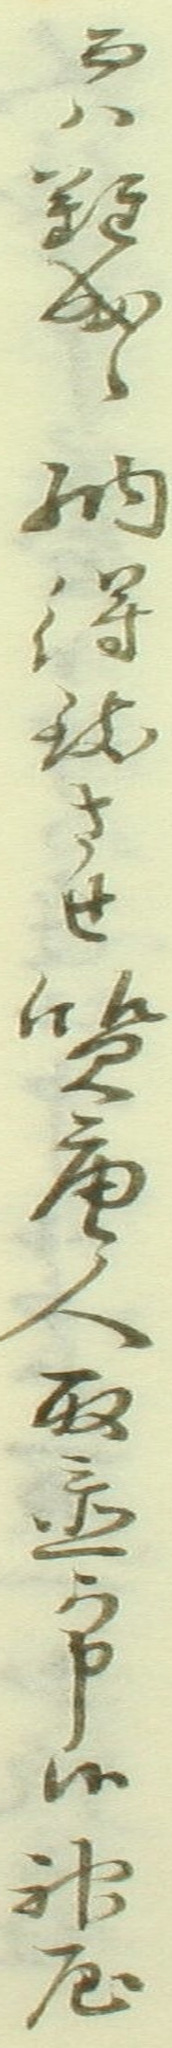而は難成候納得致させ質唐人取置可申候神屋
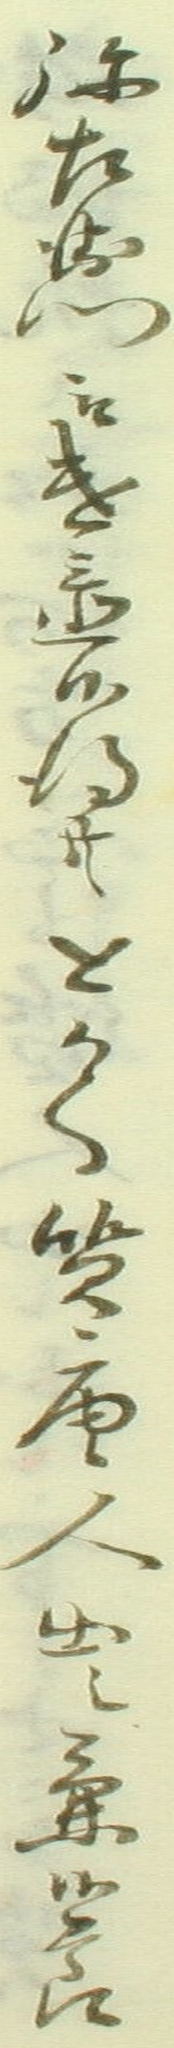弥左衛門被遣置候得共とく〳〵質唐人出し兼候節
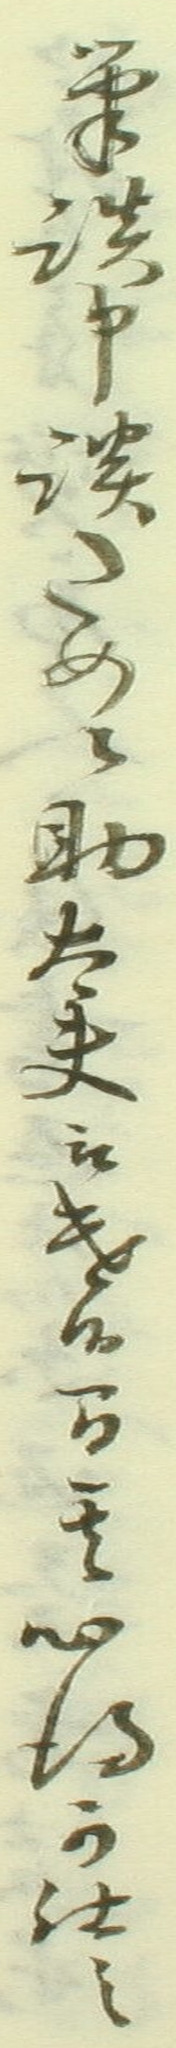筆談申談ために助太夫被遣候間其心得可仕之
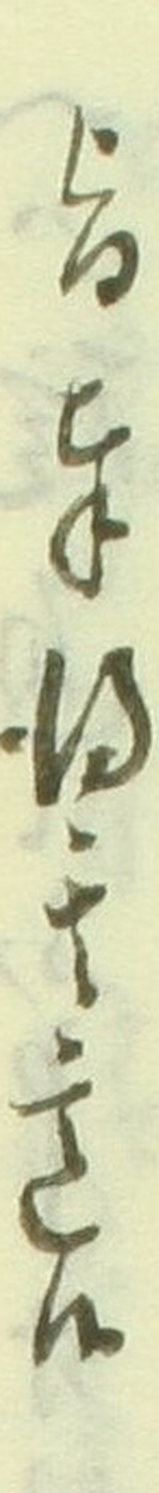旨奉得其意候
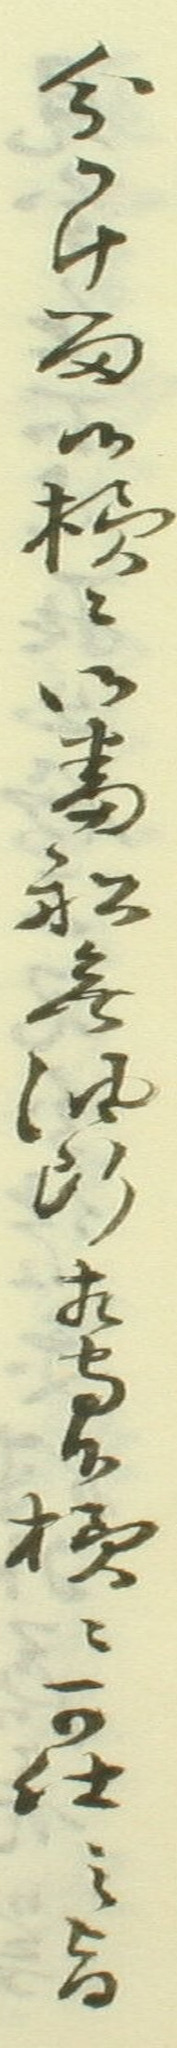分かけ留候様に御番船無油断相守候様に可仕之旨
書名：異国船漂着記
